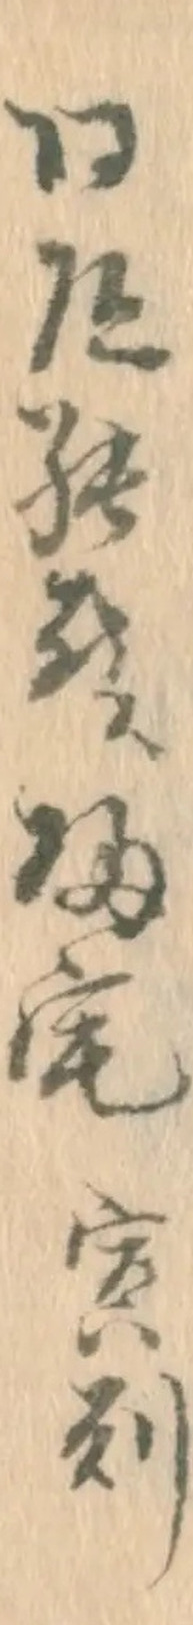同道罷越ス帰宅寅刻
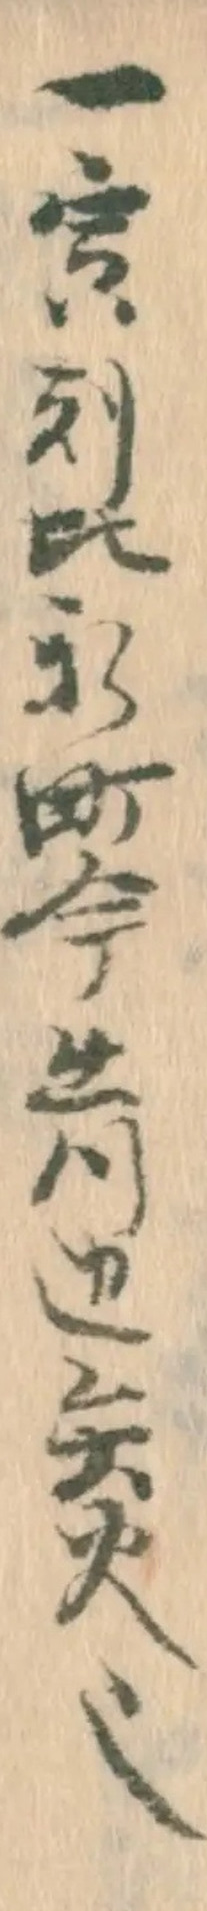一寅刻頃新町今出川辺失火也
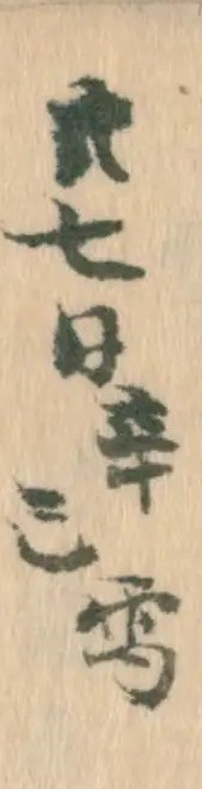廿七日辛巳雪
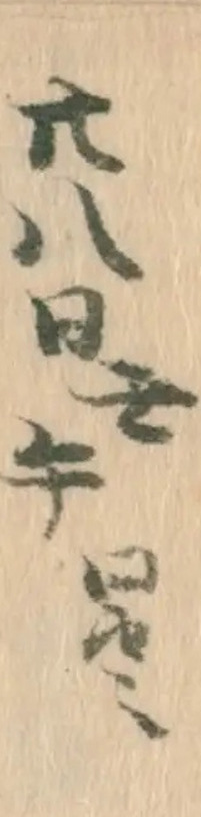廿八日壬午曇
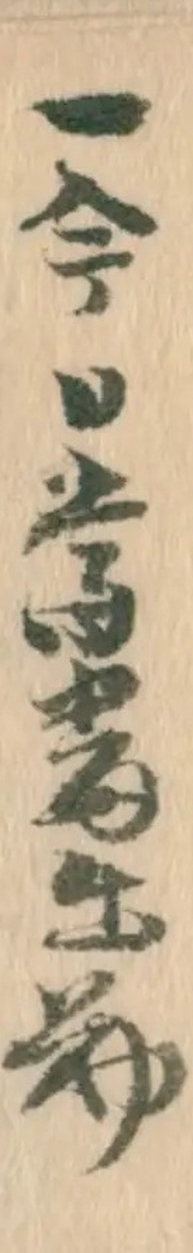一今日当番出勤
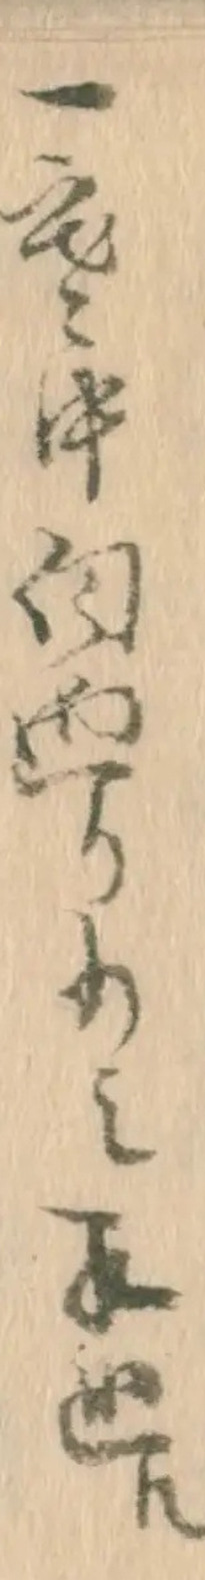一寒中伺廻り少シ相廻ル
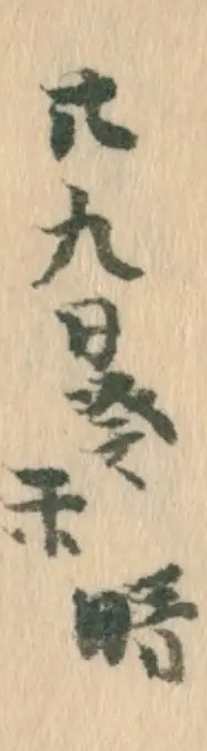廿九日癸未晴
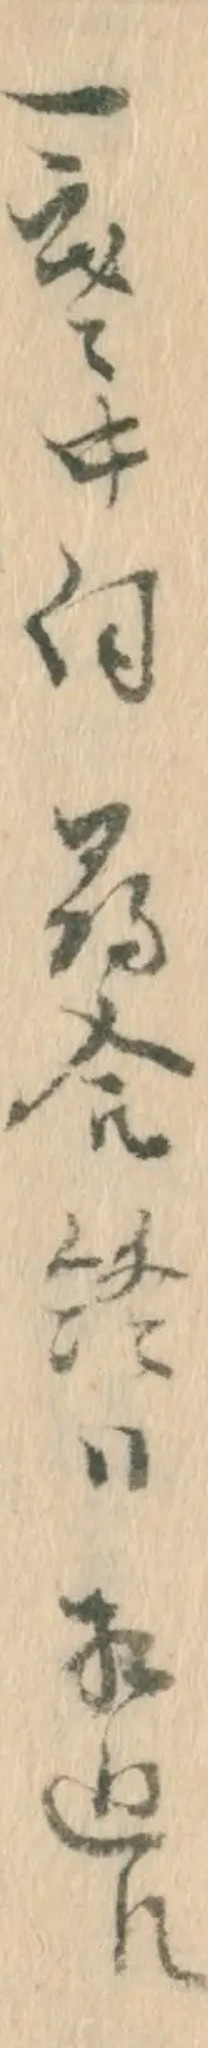一寒中伺尋合終日相廻ル

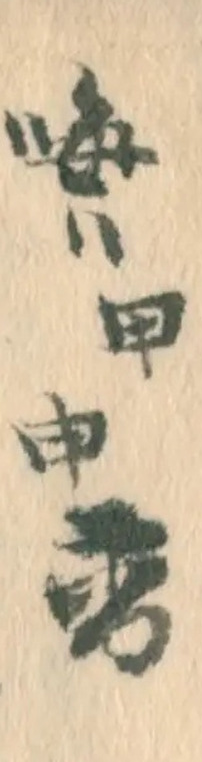晦日甲申雪
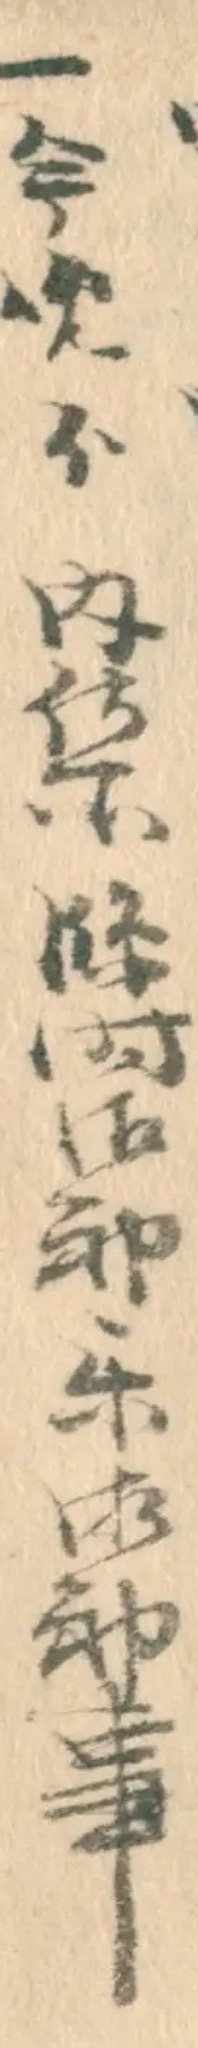一今晩ゟ内侍所臨時御神楽御神事
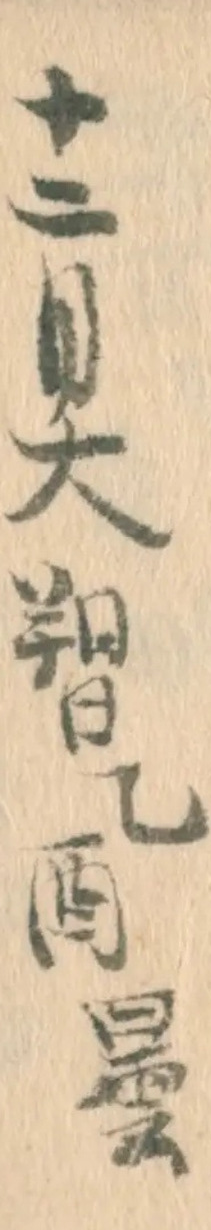十二月大朔日乙酉曇
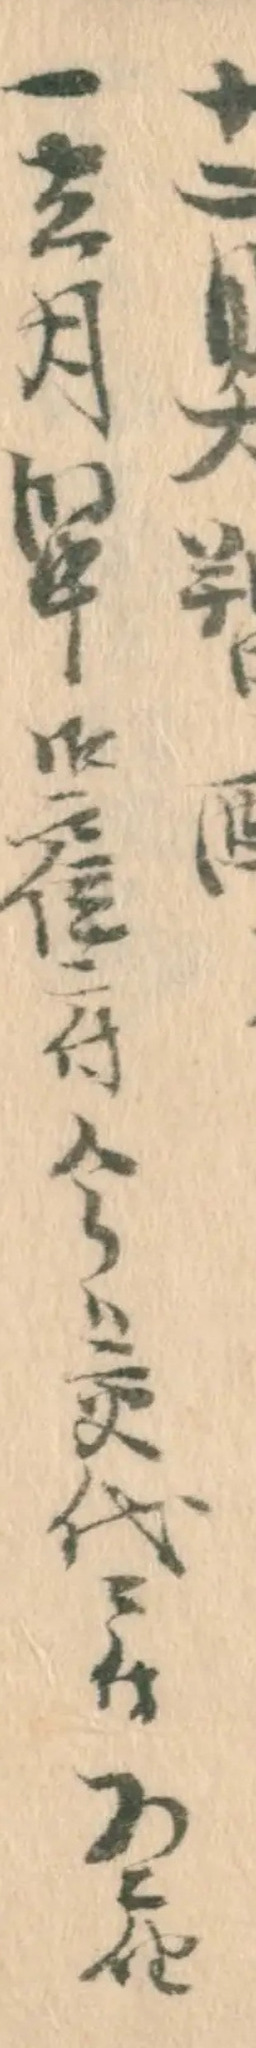一去月洞中御雇ニ付今日交代ニ付為雇
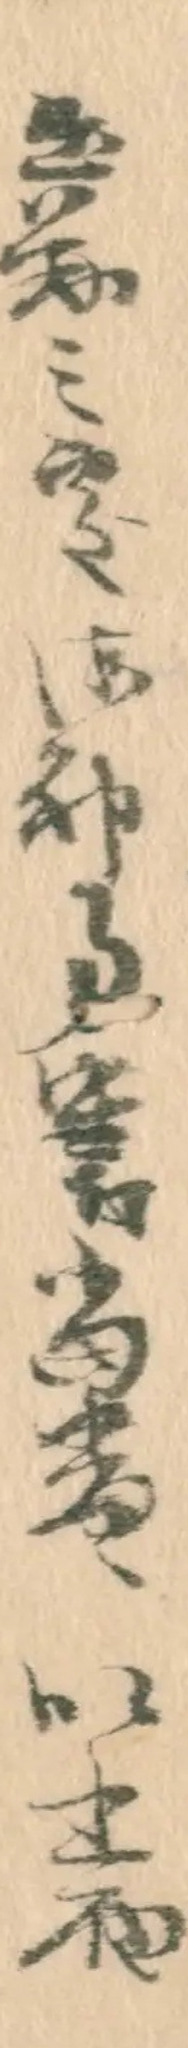出勤之処御神事中ニ付当番へ以書面
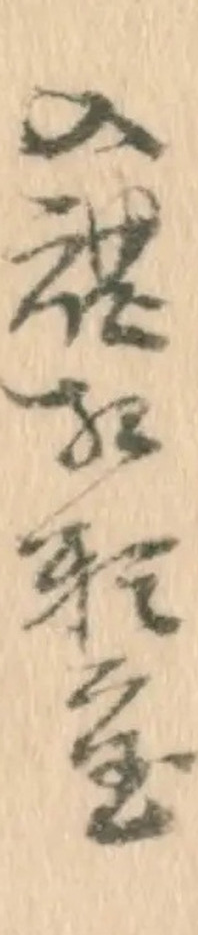入礼相頼置
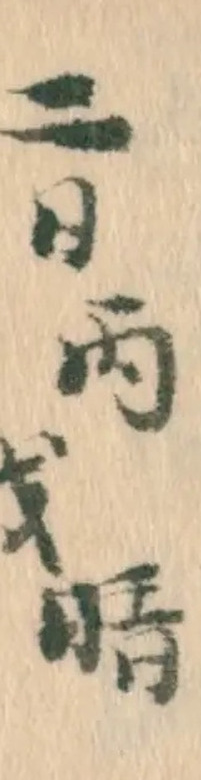二日丙戌晴
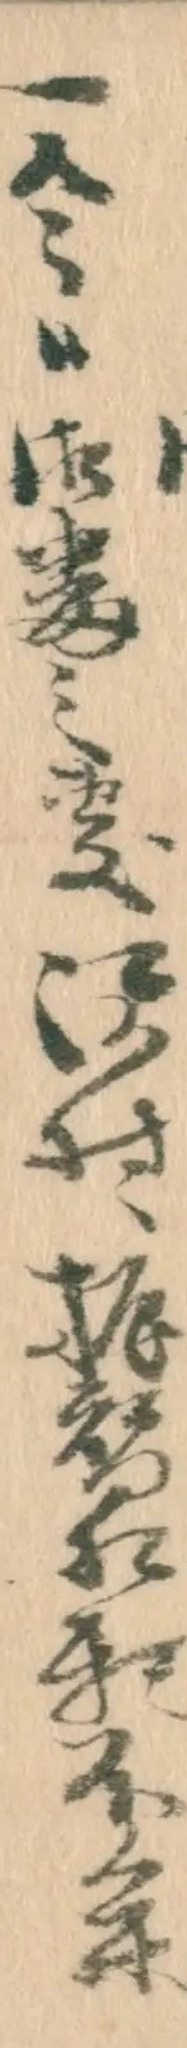一今日御番之処沢村へ振替相頼不参
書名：禁裏御所御用日記. [131]
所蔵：国立国会図書館 National Diet Library, JAPAN
